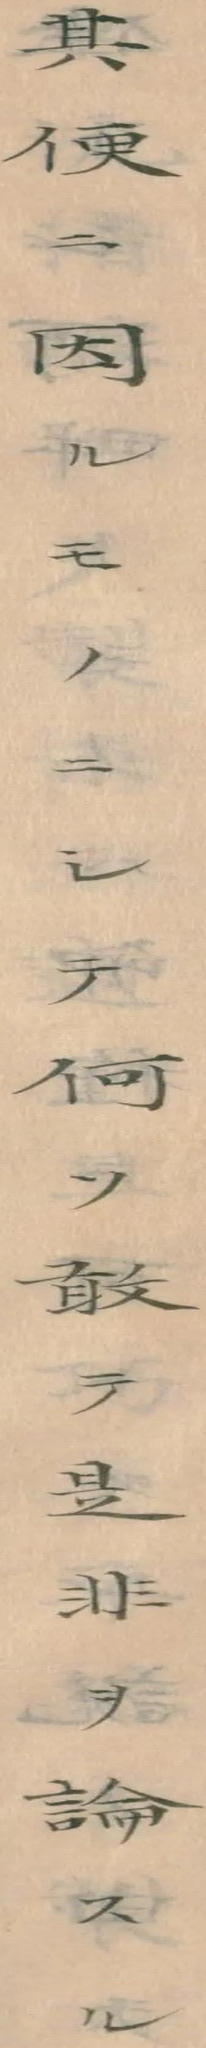其便ニ因ルモノニシテ何ソ敢テ是非ヲ論スル
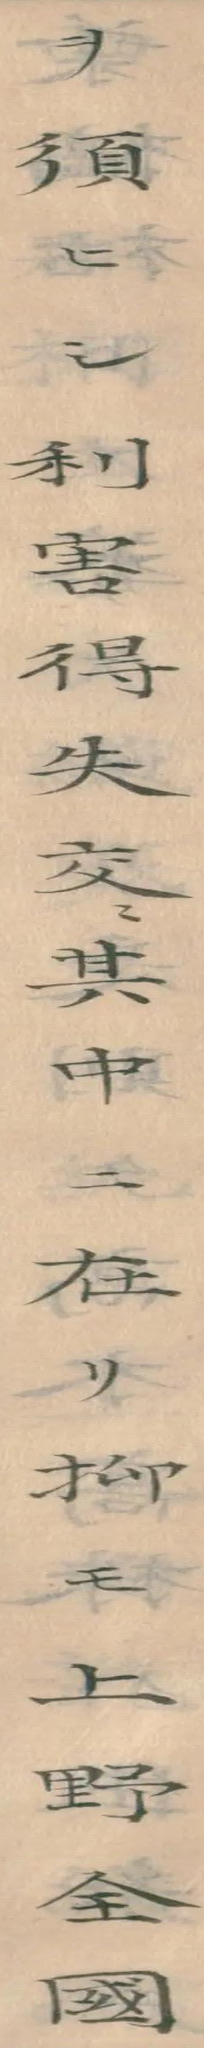ヲ須ヒシ利害得失交々其中ニ在リ抑モ上野全国
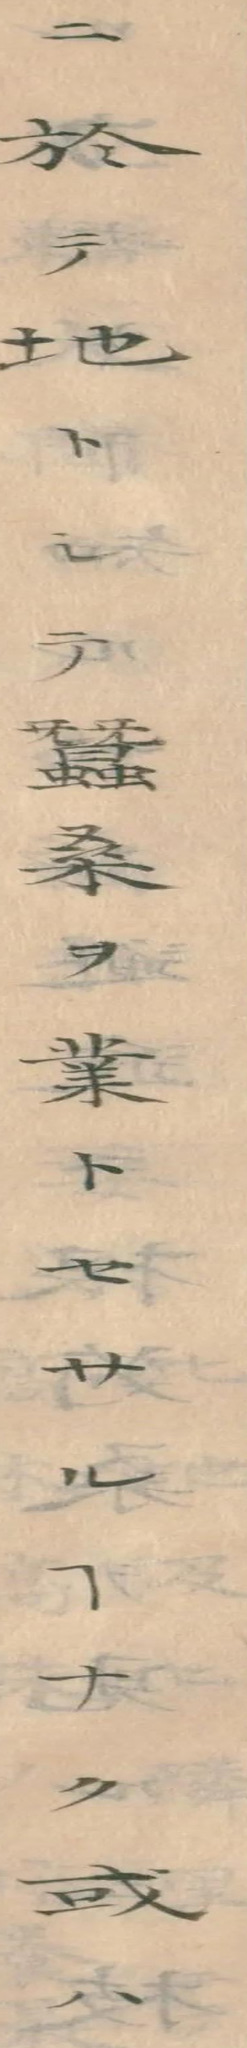ニ於テ地トシテ蚕桑ヲ業トセサルコトナク或ハ
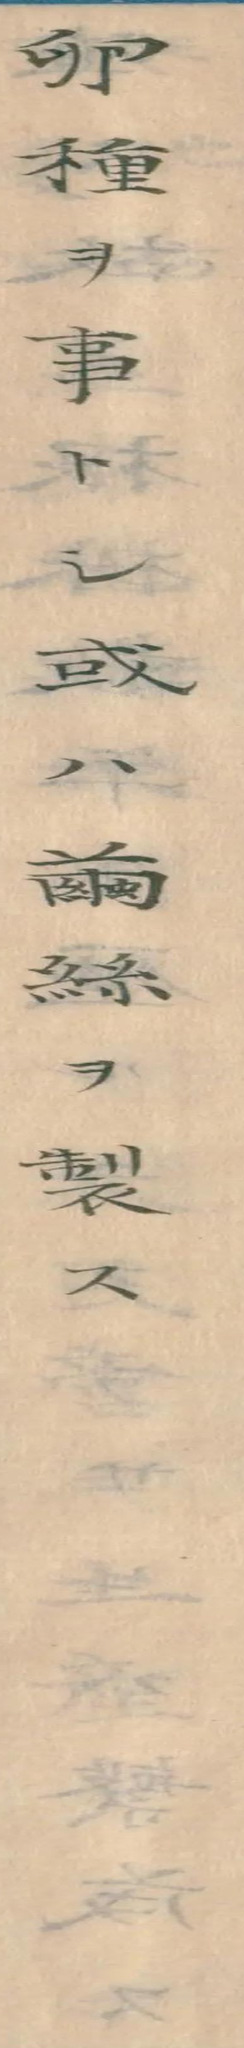卵種ヲ事トシ或ハ繭糸ヲ製ス
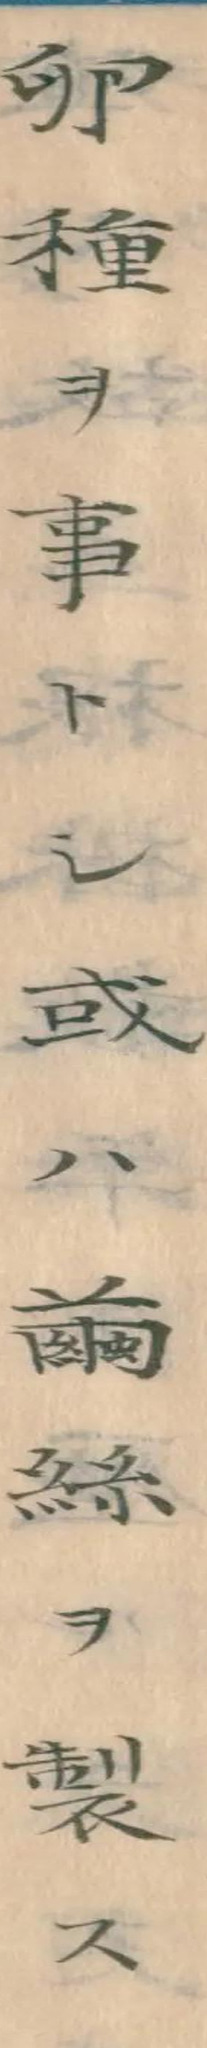卵種ヲ事トシ或ハ繭糸ヲ製ス
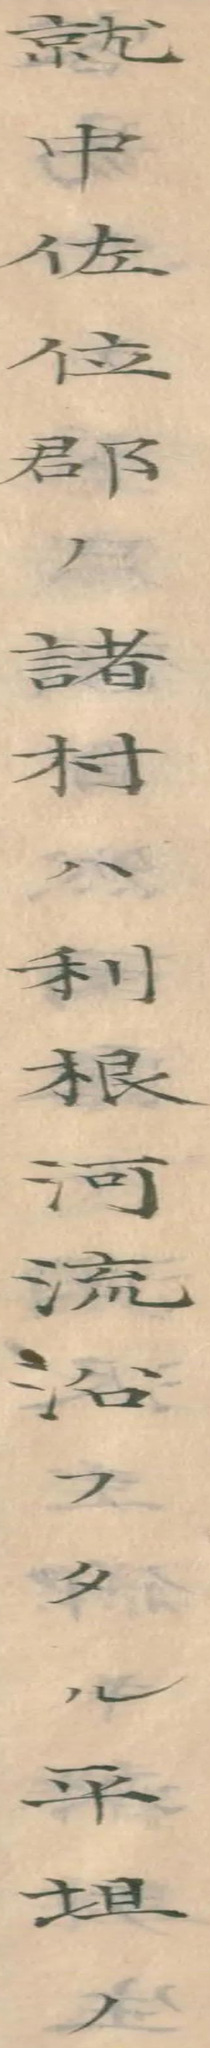就中佐位郡ノ諸村ハ利根河流沿フタル平坦ノ
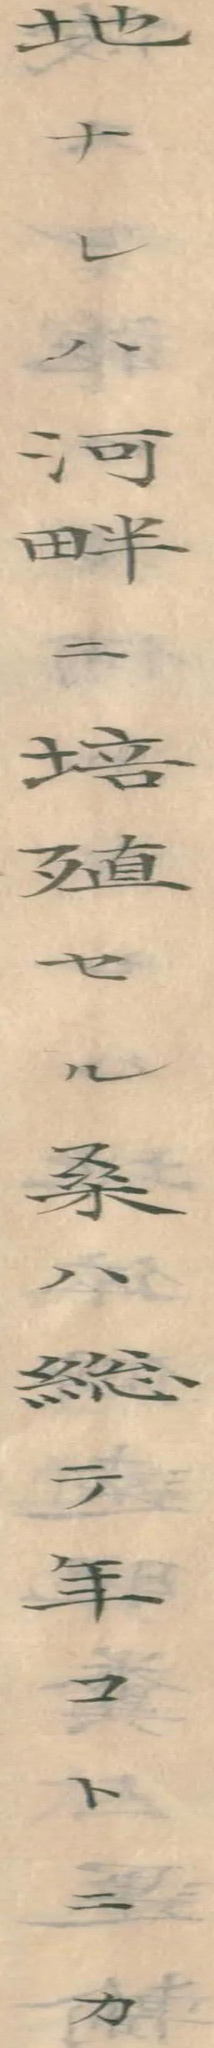地ナレハ河畔ニ培殖セル桑ハ総テ年コトニカ
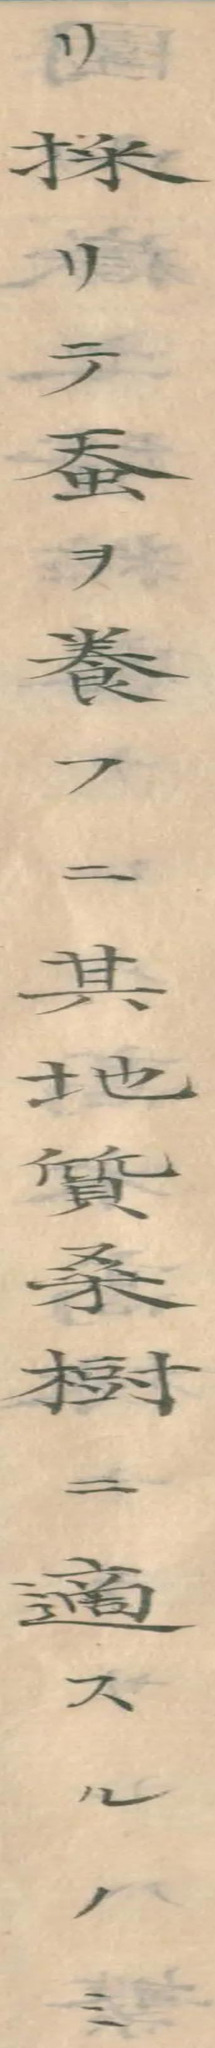リ採リテ蚕ヲ養フニ其地質桑樹ニ適スルノミ
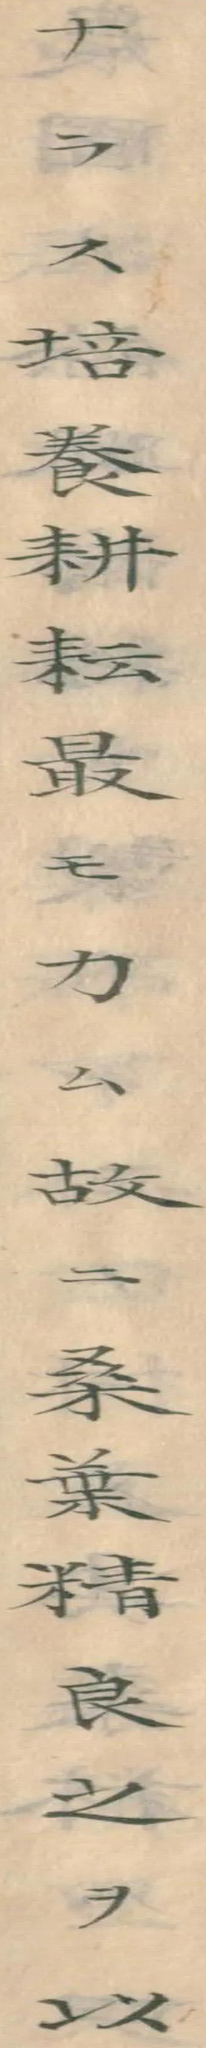ナラス培養耕耘最モ力ム故ニ桑葉精良之ヲ以
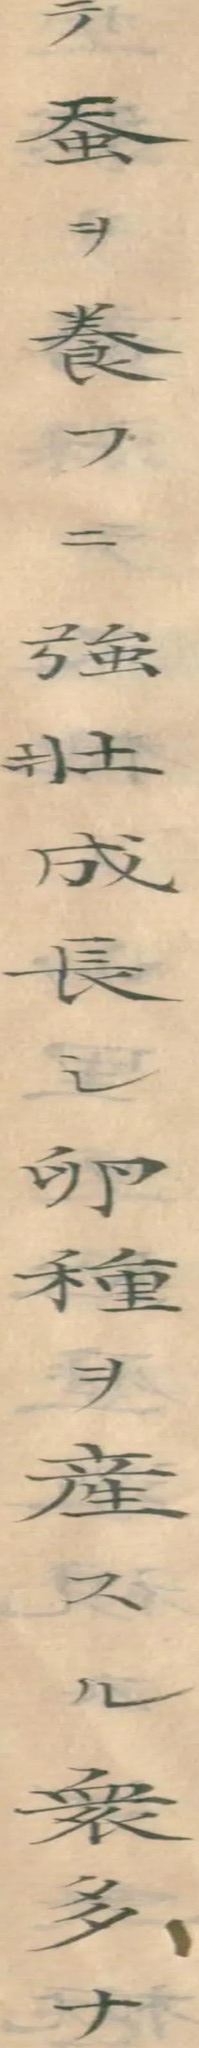テ蚕ヲ養フニ強壮成長シ卵種ヲ産スル衆多ナ

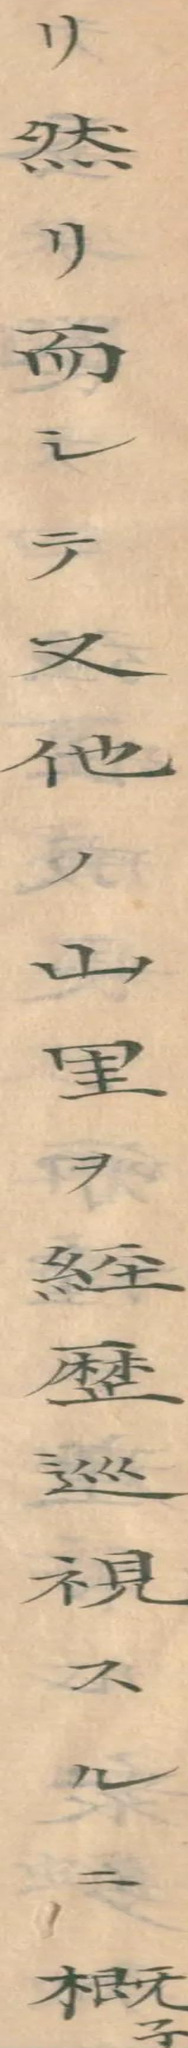リ然リ而シテ又他ノ山里ヲ経歴巡視スルニ概ネ
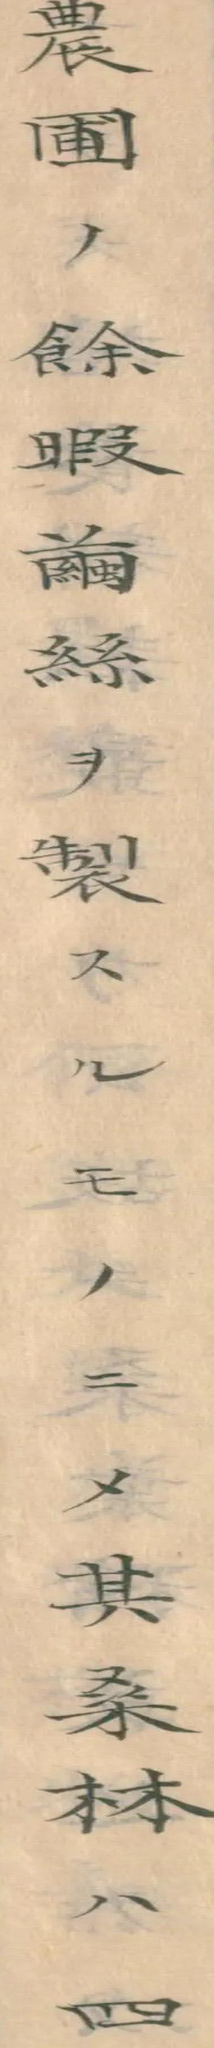農圃ノ余暇繭糸ヲ製スルモノニシテ其桑林ハ四
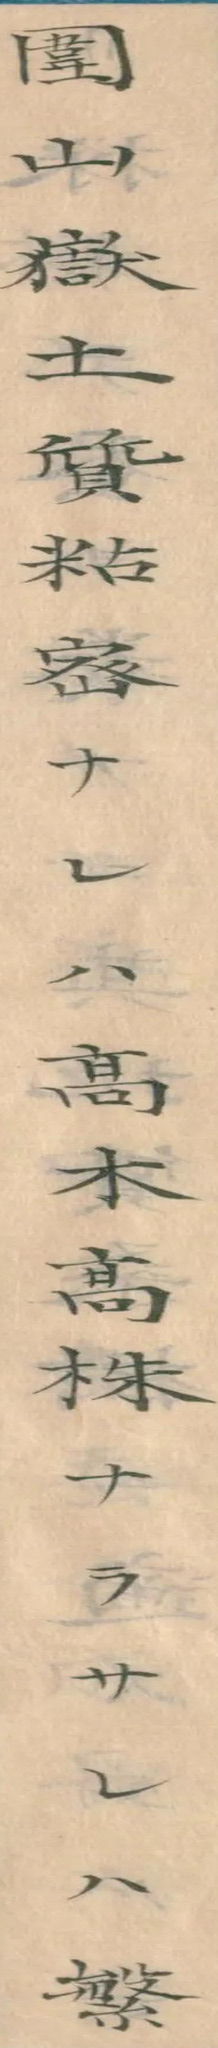囲山嶽土質粘密ナレハ高木高株ナラサレハ繁
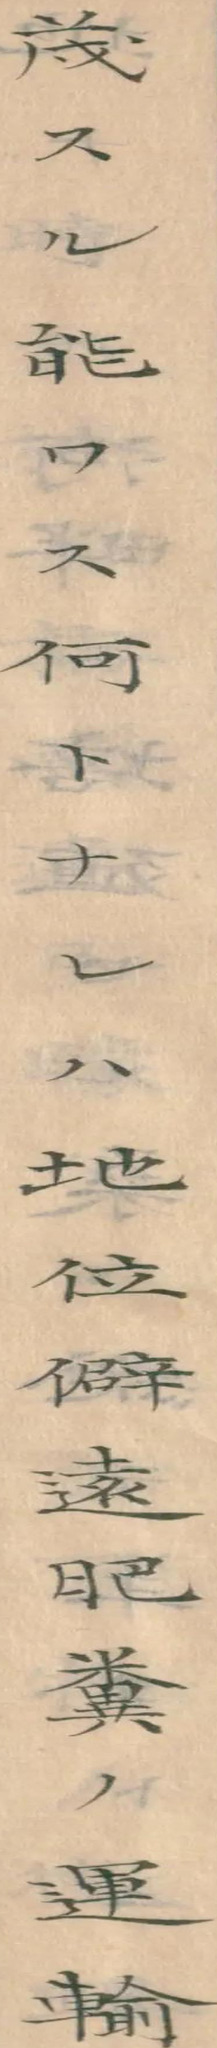茂スル能ワス何トナレハ地位僻遠肥糞ノ運輸
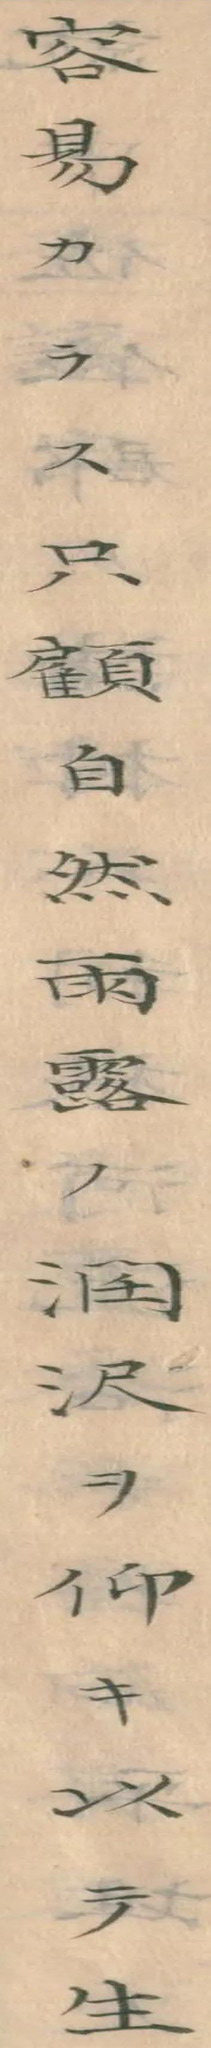容易カラス只顧自然雨露ノ潤沢ヲ仰キ以テ生
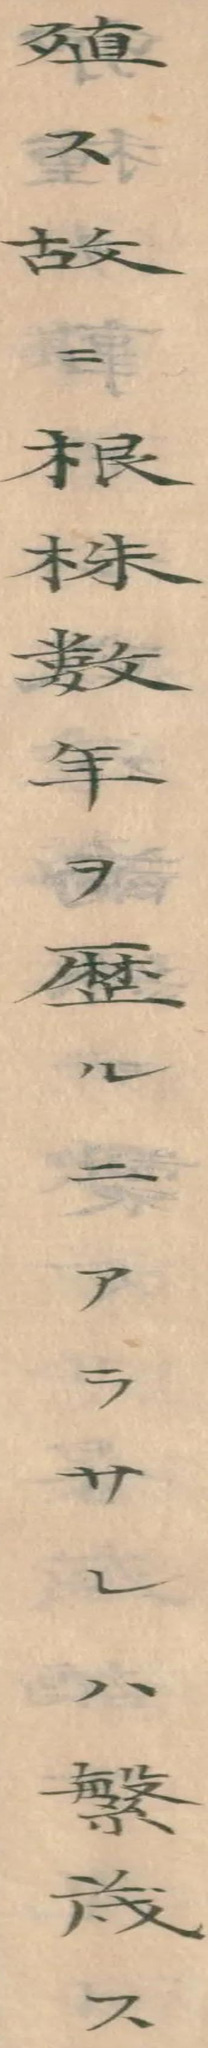殖ス故ニ根株数年ヲ歴ルニアラサレハ繁成ス
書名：蚕桑集成
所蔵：国立国会図書館 National Diet Library, JAPAN
